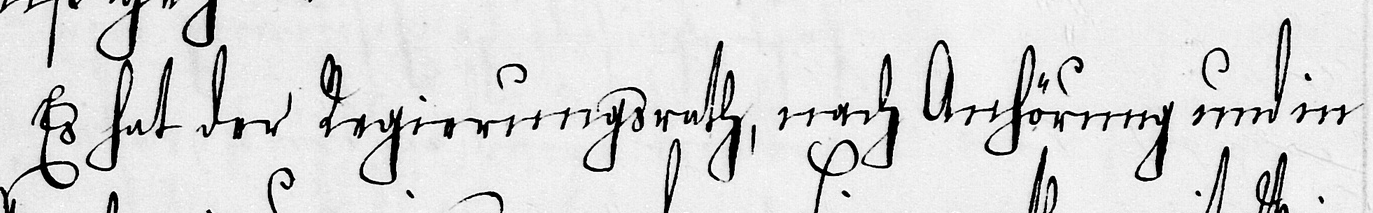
Es hat der Regierungsrath, nach Anhörung und in
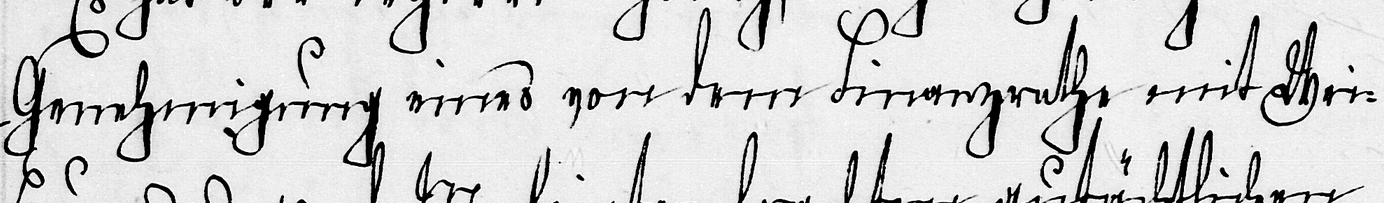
Genehmigung eines von dem Finanzrathe mit Wei¬
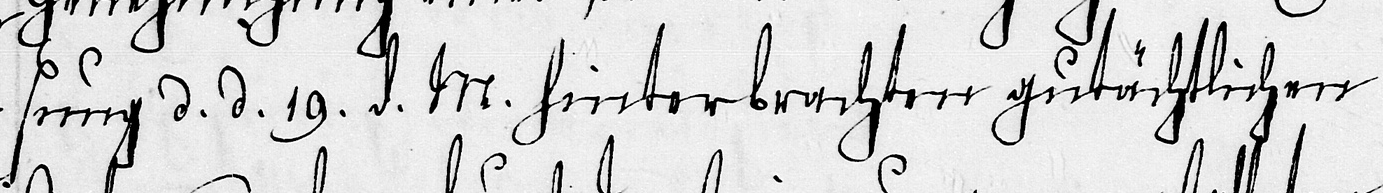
sung d. d. 19. d. M. hinterbrachten gutächtlichen
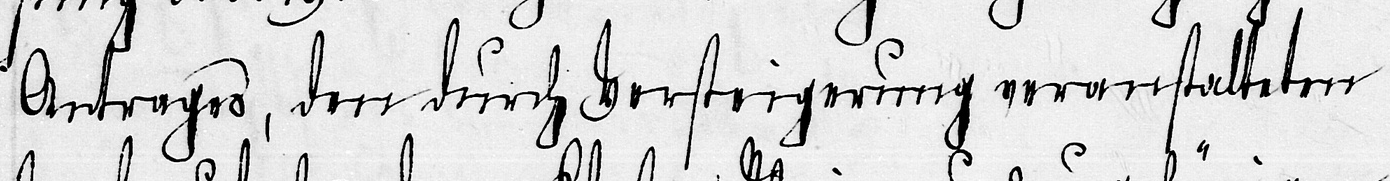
Antrages, den durch Versteigerung veranstalteten
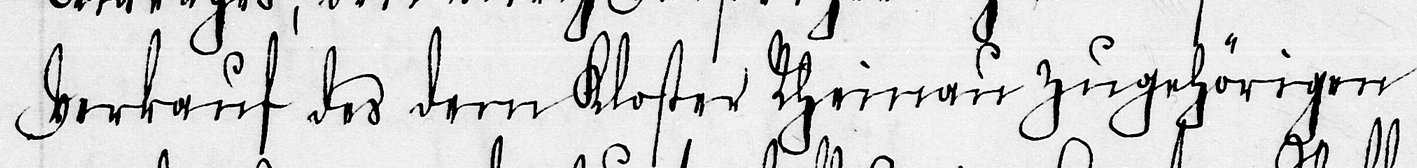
Verkauf des dem Kloster Rheinau zugehörigen
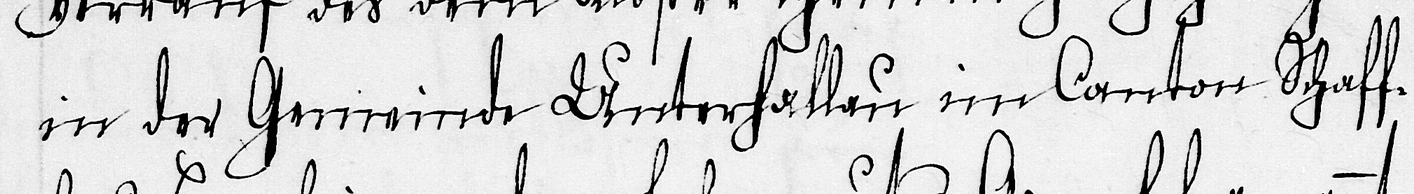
in der Gemeinde Unterhallau im Canton Schaf¬
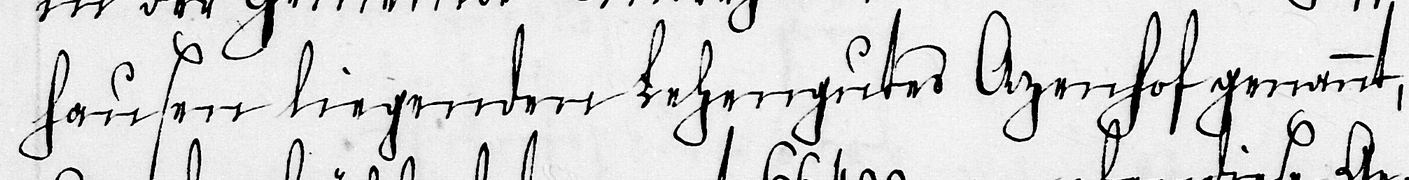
fhausen liegenden Lehengutes Azenhof genann¬
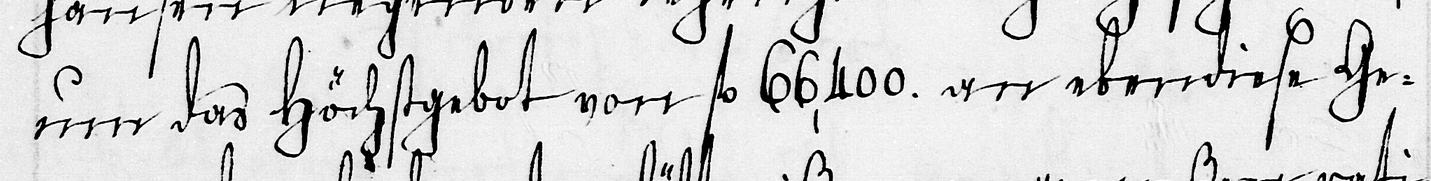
um das Höchstgebot von fl. 66,400. an ebendiese Ge¬
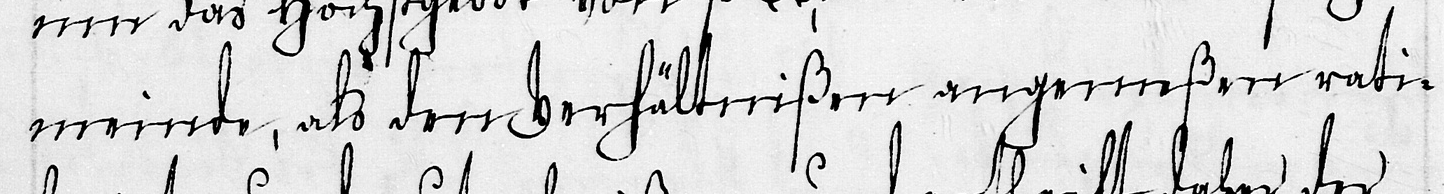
meinde, als den Verhältnißen angemeßen rati¬
